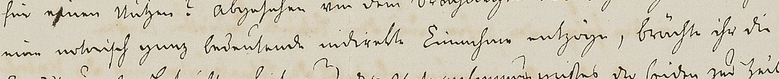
eine notorisch ganz bedeutende indirekte Einnahme entzöge, brächte ihr die
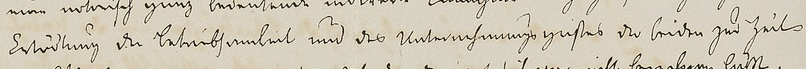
Ertödtung der Betriebsamkeit und des Unternehmungsgeistes der beiden zur Zeit
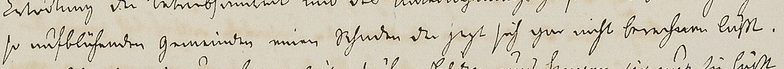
so aufblühenden Gemeinden einen Schaden der jezt sich gar nicht berechnen läßt.
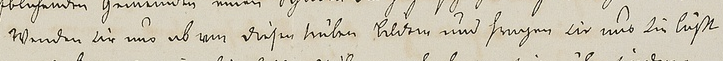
Wenden wir uns ab von diesen trüben Bildern und fragen wir uns wie läßt
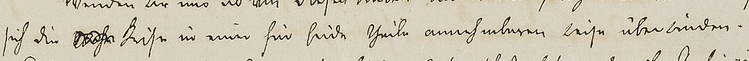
sich die Krise in einer für beide Theile annehmbaren Weise überwinden.
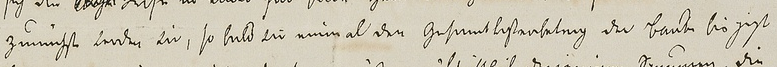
Zunächst werden wir, so bald wir einmal den Gesamtkostenbetrag der Baute bis jezt
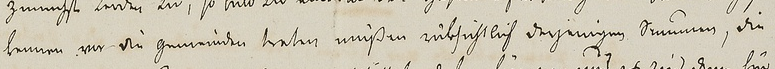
kennen vor die Gemeinden treten müßen rüksichtlich derjenigen Summen, die
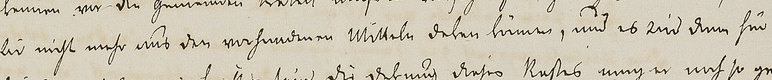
wir nicht mehr aus den vorhandenen Mitteln deken können, und es wird dann für
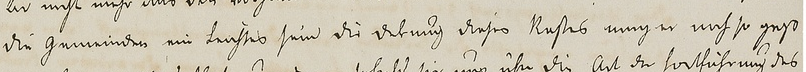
die Gemeinden ein Leichtes sein die Dekung dieses Restes mag er noch so groß
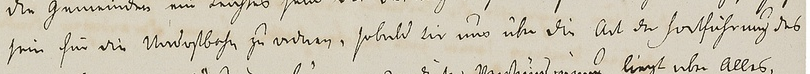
sein für die Nordostbahn zu ordnen, sobald wir uns über die Art der Forführung des
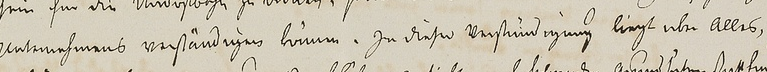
Unternehmens verständigen können. In dieser Verständigung liegt aber Alles,
